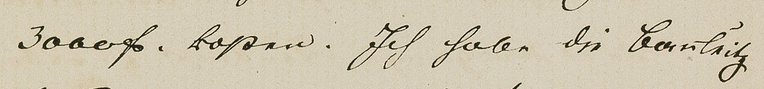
3000 fs. kosten. Ich habe die Bauleitg
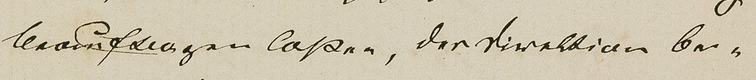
beauftragen laßen, der Direktion be-
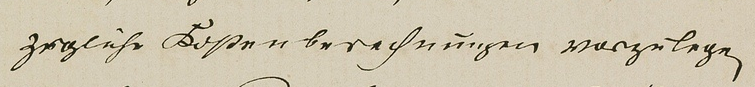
zügliche Kostenberechnungen vorzulegen.
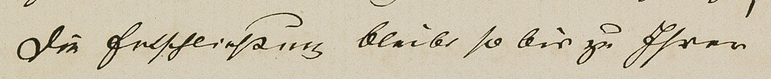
Die Entschließung bleibt so bis zu Ihrer
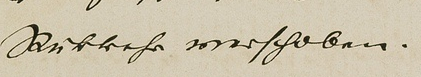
Rükkehr verschoben. –
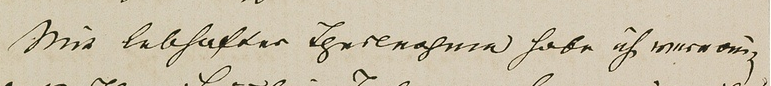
Mit lebhafter Theilnahme habe ich vernommen,
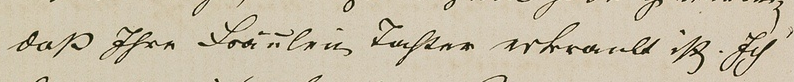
daß Ihre Fräulein Tochter erkrankt ist. Ich
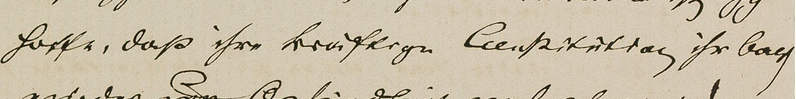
hoffe, daß ihre kräftige Constitution ihr bald
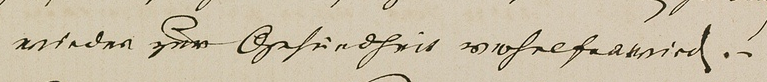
wieder zur Gesundheit verhelfen wird. –
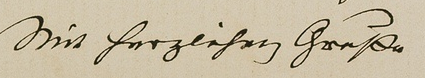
Mit herzlichem Gruße
